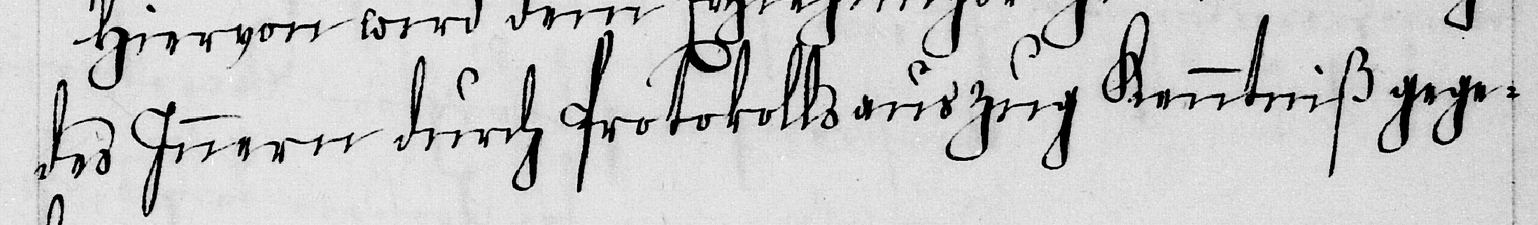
des Innern durch Protokollsauszug Kenntniß gege¬
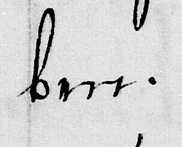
ben.
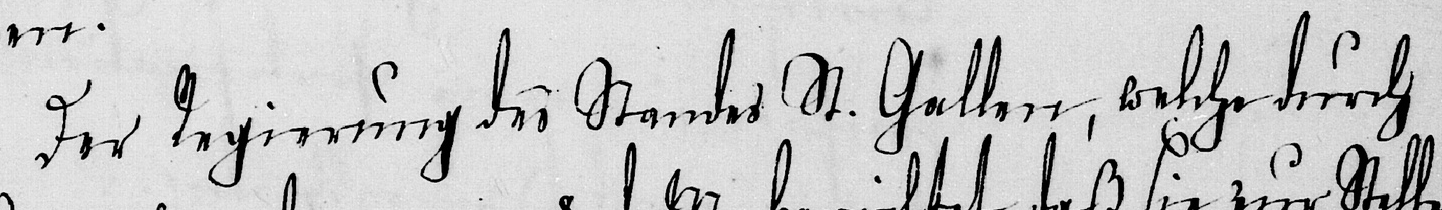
Der Regierung des Standes St. Gallen, welche durch
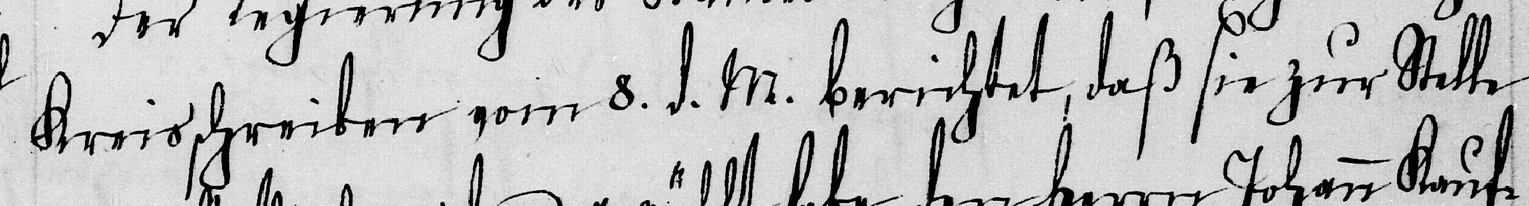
Kreisschreiben vom 8. d. M. berichtet, daß sie zur Stelle
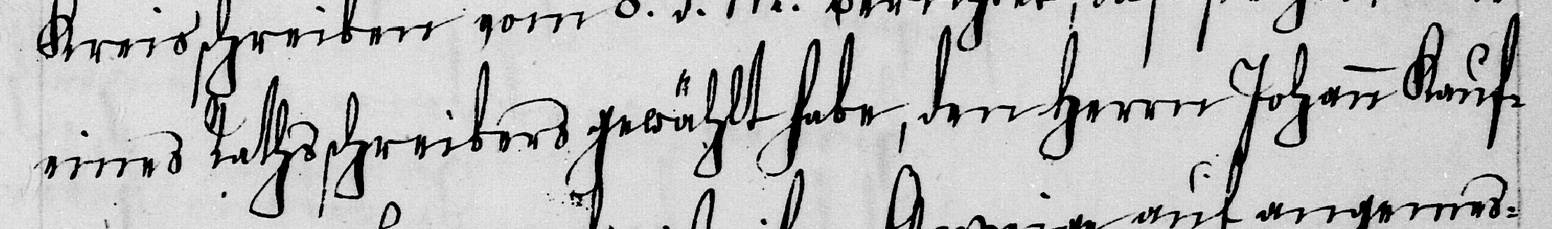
eines Rathsschreibers gewählt habe, den Herrn Johann Kauf¬
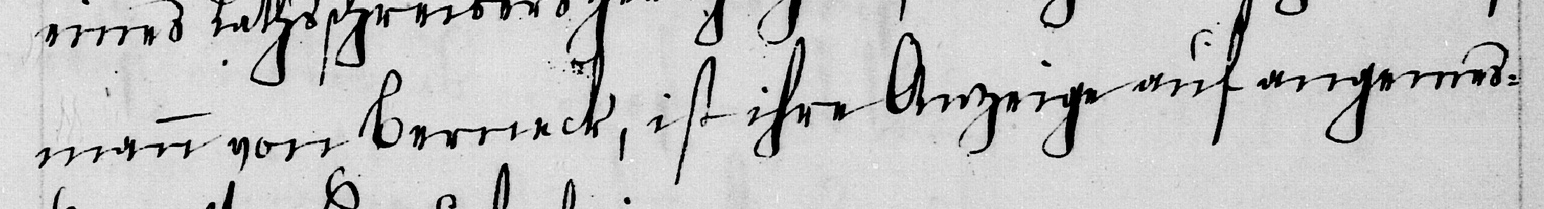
mann von Berneck, ist Anzeige auf angemeß¬
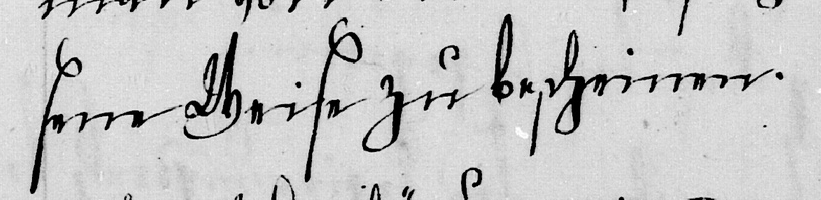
ene Weise zu bescheinen.
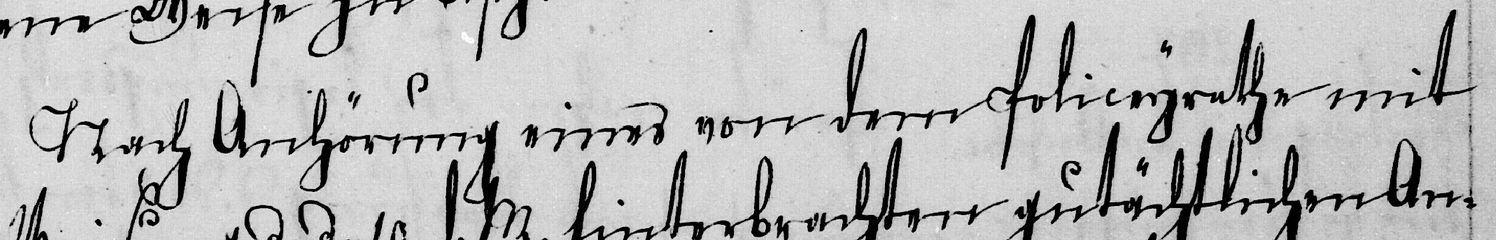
Nach Anhörung eines von dem Policeyrathe mit
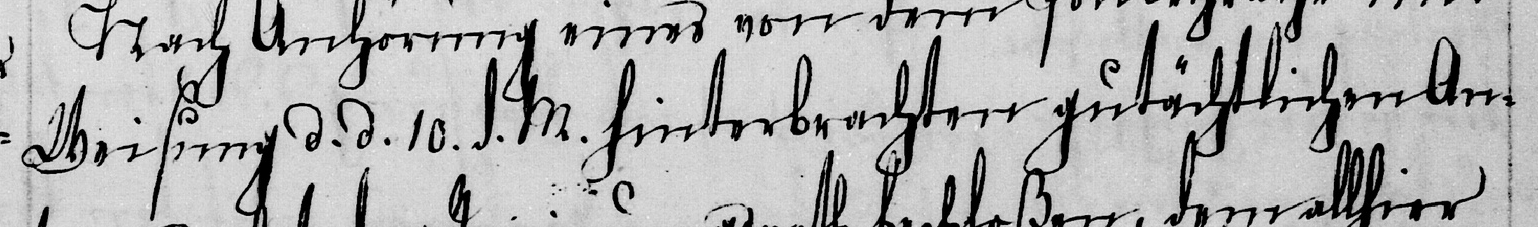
Weisung d. d. 10. d. M. hinterbrachten gutächtlichen An¬
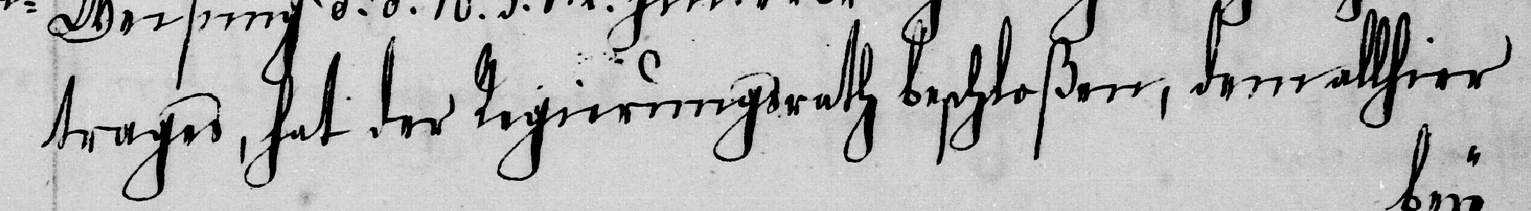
trags, hat der Regierungsrath beschloßen, dem allhier
